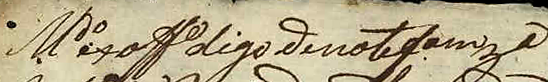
M.do ex off.o digo denote f.am za
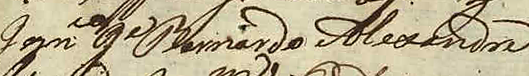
Grn.co Ge Bernardo Alexandre
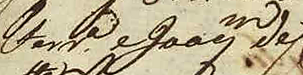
Ferr.a e Joaq.m de
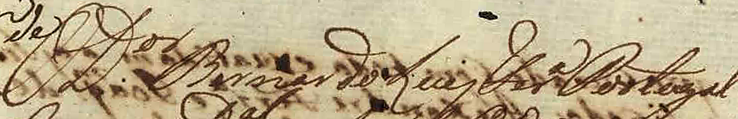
O D.or Bernardo Luis Fer.a Portugal
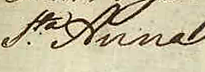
S.ta Anna
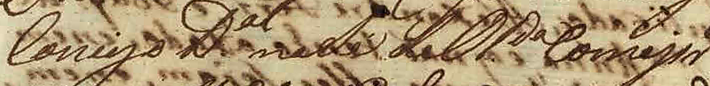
Conigo D.al na Sé de Ol.da Comissr.o
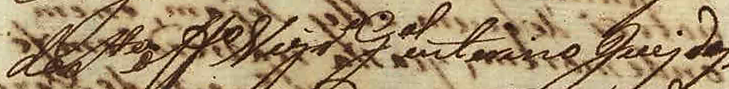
do Sto off.o Vigr.o G.al enterino Juis dos,
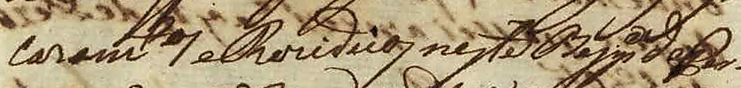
cazam.tos e Reziduos neste Besp.o de Per
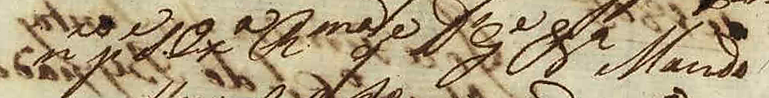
n.co p.e S. Ox.a R.ma e D.s G.e V.a Mando
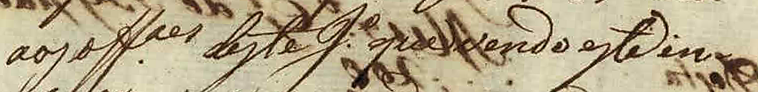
aos off.aes deste G.e que vendo este in
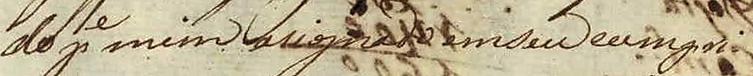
do p.e mim asignado em seu cumpri
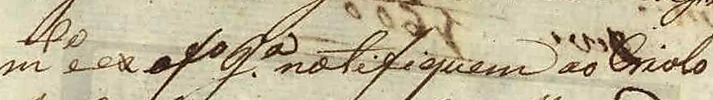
m.to e ex of.o G.a notifiquem ao Criolo
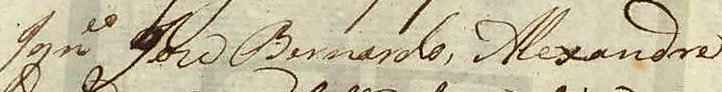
Jgn.eo Joze Bernardo, Alexandre
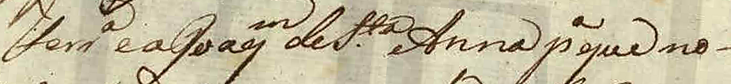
Ferr.a e a Joaq.m de S.ta Anna p.a que no
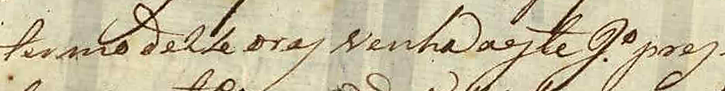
termo de 24 oras venha a este G.e pres
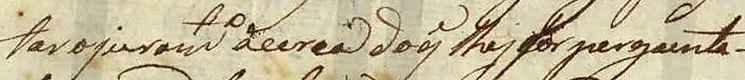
tar o juram.to de crea do q̄ lhes for pergunta
